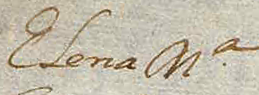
ELena M.a
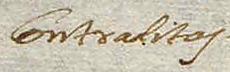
Contraditas
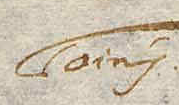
Toins̄
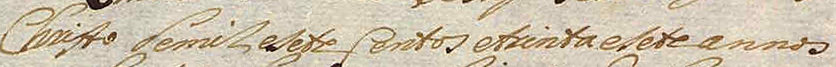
Christo de mil e seteCentos e trinta e sete annos
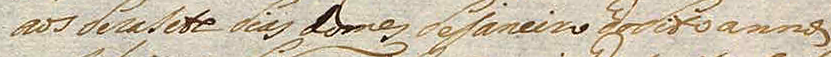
aos dezasete dias do mes de janeiro do dito anno
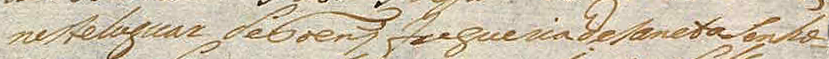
neste luguar de Toens̄ freguezia de sancta Senho
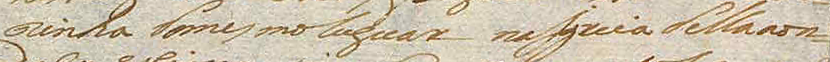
rinha do mesmo luguar na Jgreia della aon
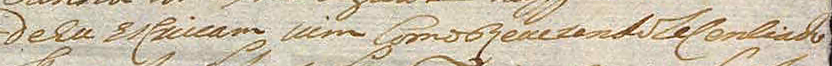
de Eu EsCriuam uim Com o Reuerendo ReConciado
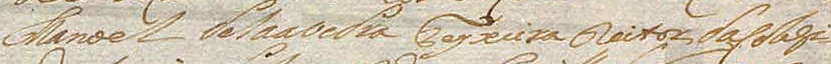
Manoel de Saavedra Teyxeira Reitor da Colegi
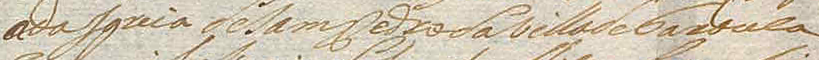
ada Jgreia de Sam Pedro da villa de Tarouca
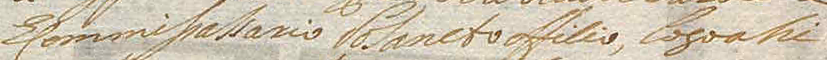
E Commissassario do Sancto officio, logo ahi
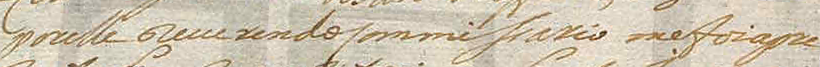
por elle Reuerendo Commissario me foi apre
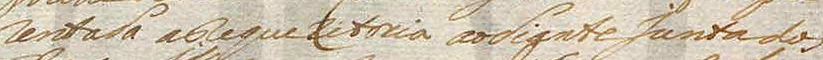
zentada a Requezitoria ao Signte Junta dos
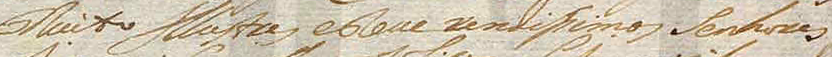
Muito Jllustres e reuerendissimos senhores
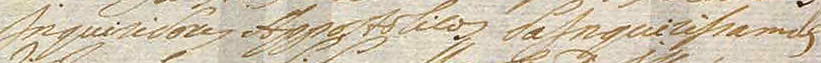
Jnquizidores Appostolicos da Jnquizissam de
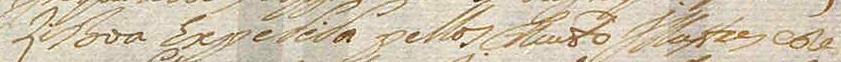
Lisboa Expedida pellos Muito Jllustres e Re
